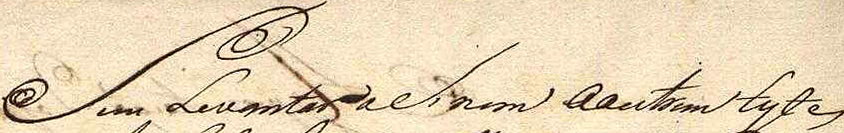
Sem Levantar aSi nem a outrem teste
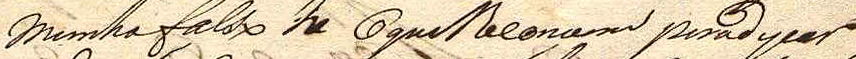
munho falso he o que lhe convem pera descar
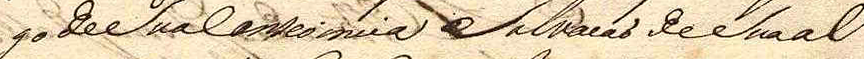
go de Sua Consciencia Salvacaõ de Sua al
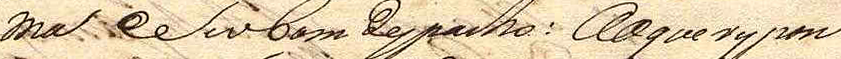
ma e Seo bom despacho: Ao que respon
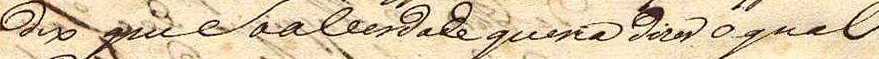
deo que So a Uerdade queria dizer o qual
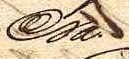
Era.
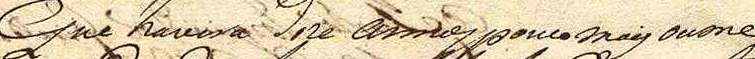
Que havera doze annos pouco mais ou me
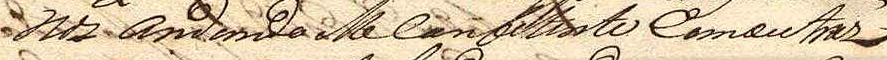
noz andando elle Confitente Com outraz
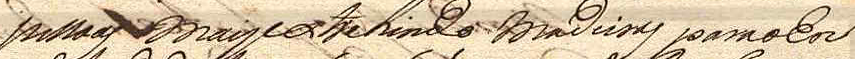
pessoas mais extrehindo madeiras para o En
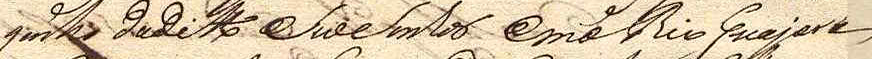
genho do dito Sue Senhor em o Rio Guajare
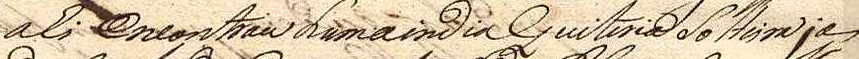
ahi encontrou huma india Quiteria Solteira ja
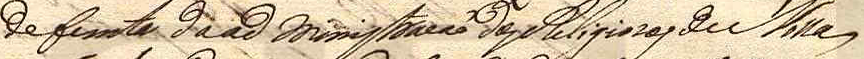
defunta da administracaõ dos Religiozos de Nossa
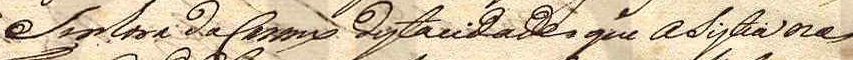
Senhora do Carmo desta cidade que aSistia na
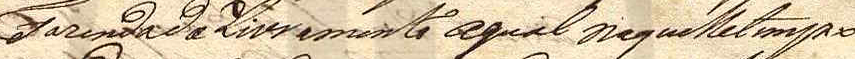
Fazenda do Livramento a qual naquelle tempo
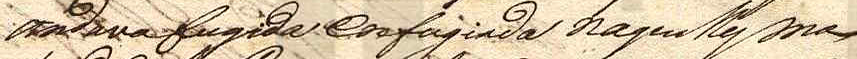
andava fugida e refugiada naquelles ma
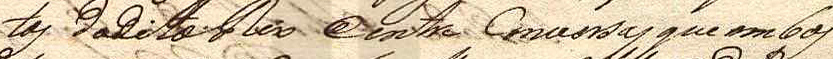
tos do dito Rio e entre Conversas que ambos
